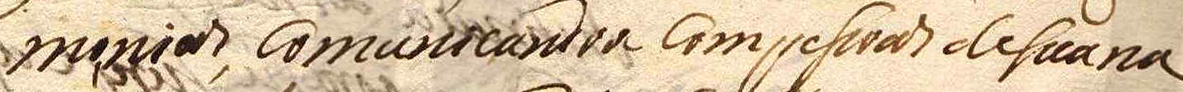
monias, comunicandoa Com pessoas de sua na
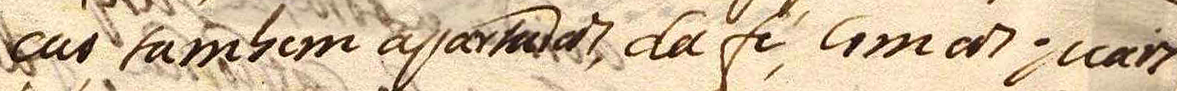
çao, tambem apartadas, da fé, com as quais
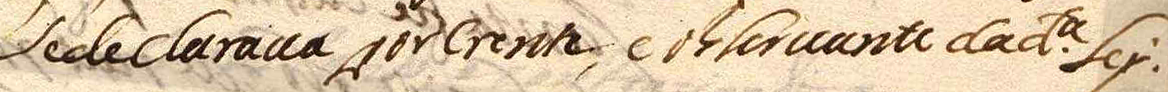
se declaraua por crente, e obseruante da d̄.a Ley.
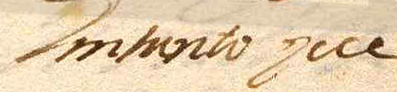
Emtanto que
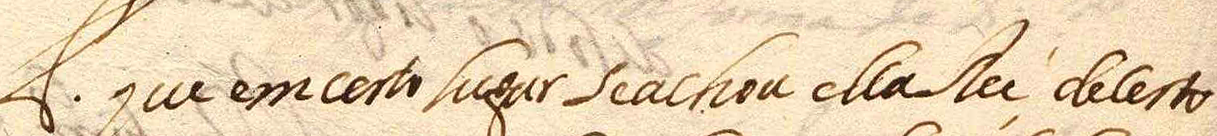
P. que em certo lugar se achou ella Ree de certo
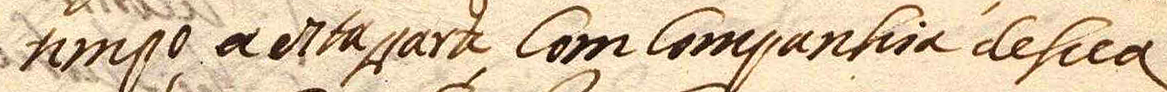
tempo, a esta parte Com Companhia de sua
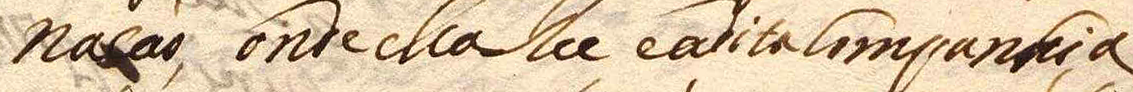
naçaõ, onde ella Ree, e a dita Companhia,
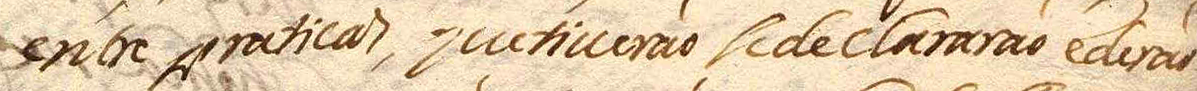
entre praticas, que tiuerao se declararaõ e deraõ
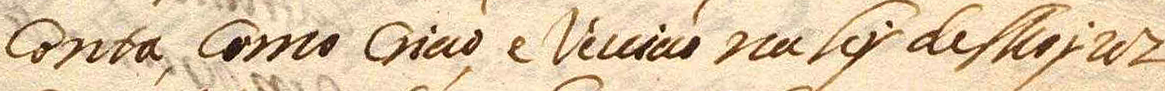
conta, como criaõ, e Veuiaõ na ley de Moyzez
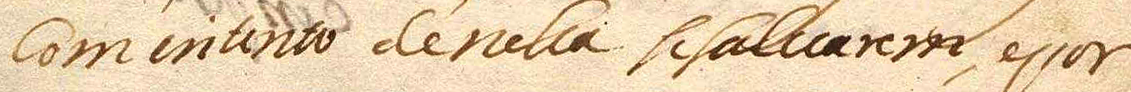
com intento de nella se saluarem, e por
